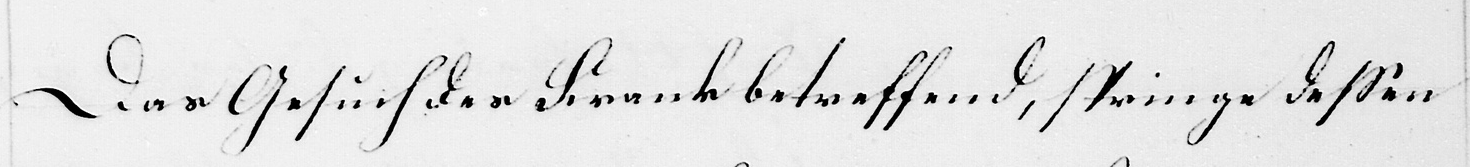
Das Gesuch des Frank betreffend, springe deßen
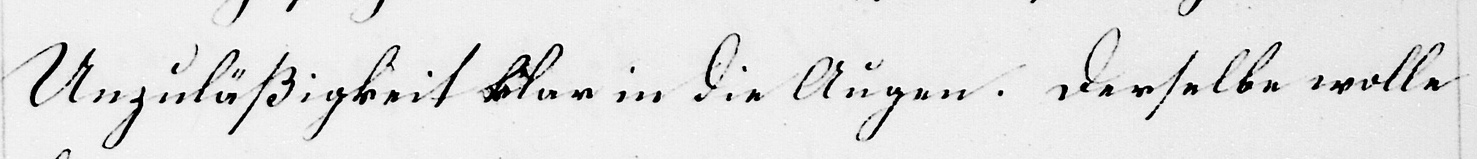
Unzuläßigkeit klar in die Augen. Derselbe wolle
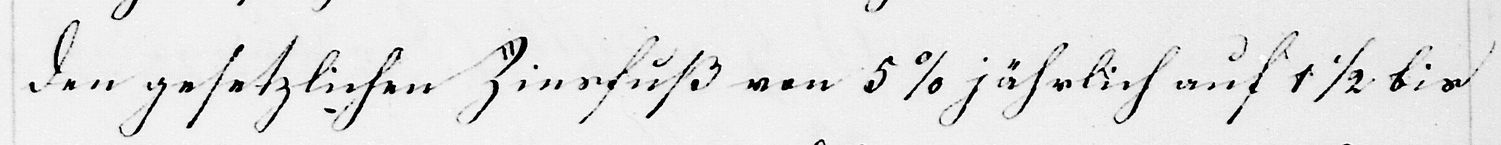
den gesetzlichen Zinsfuß von 5 % jährlich auf 1 ½ bis
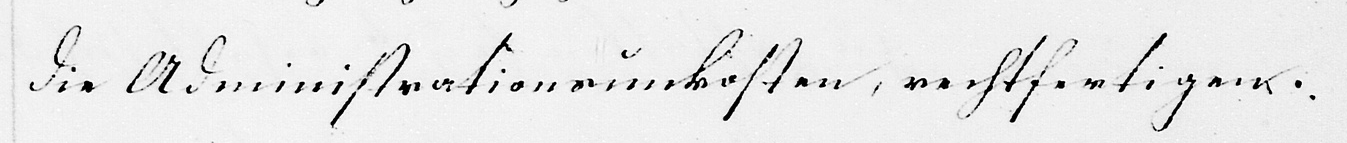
die Administrationsunkosten, rechtfertigen.
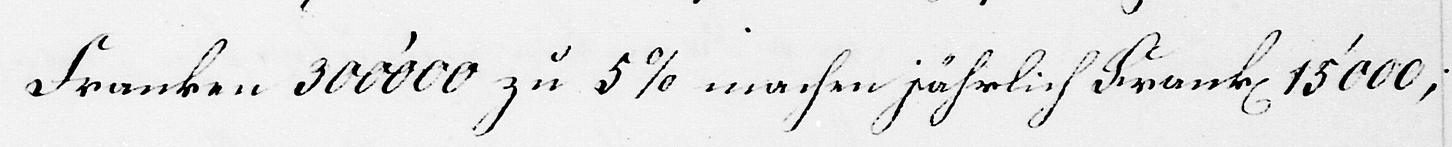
Franken 300‘000 zu 5 % machen jährlich Frank[en] 15‘000;
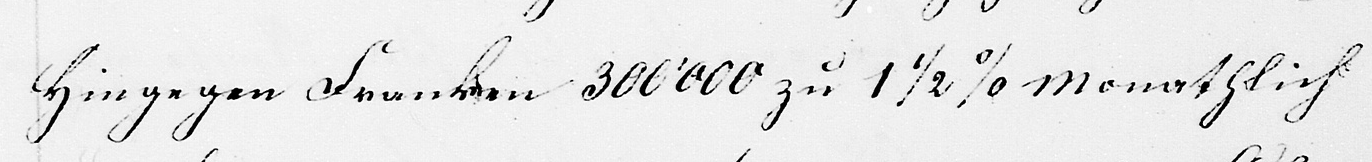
Hingegen Franken 300‘000 zu 1 ½ % monathlich
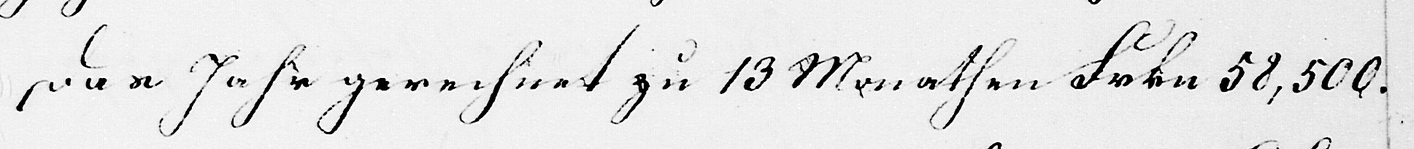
Das Jahr gerechnet zu 13 Monathen Frkn 58,500.
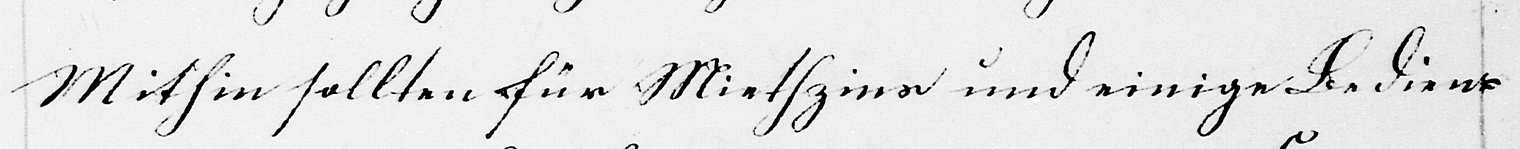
Mithin sollten für Miethzins und einige Bedien¬
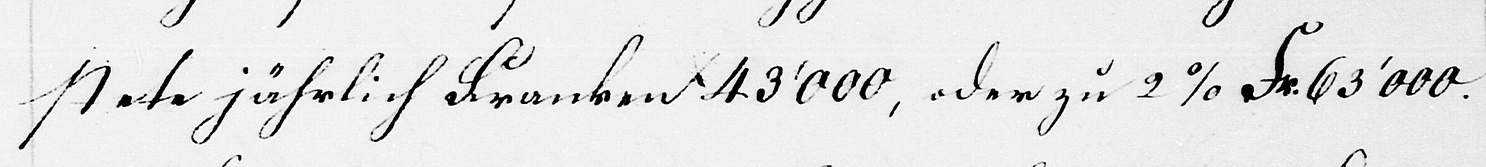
stete jährlich Franken 43‘000, oder zu 2 % Fr. 63‘000.
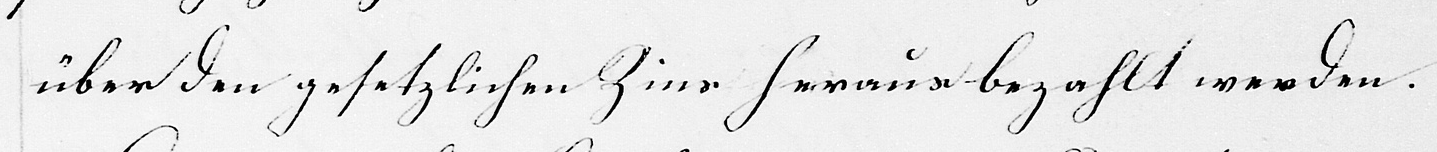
über den gesetzlichen Zins heraus bezahlt werden.
